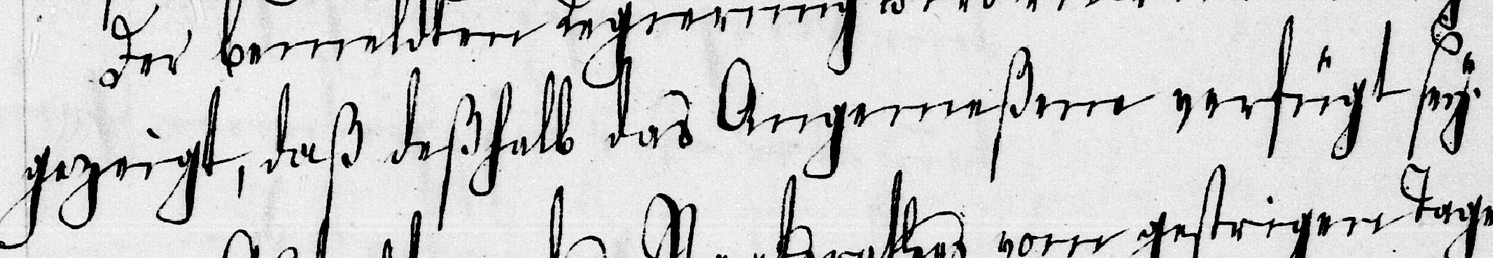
gezeigt, daß deßhalb das Angemeßene verfügt sey.
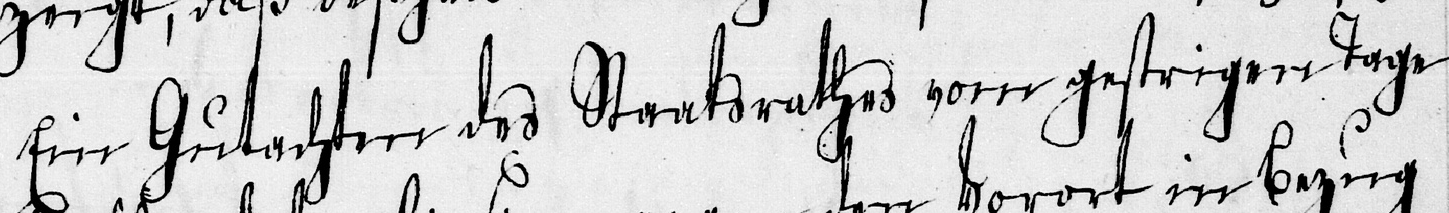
Ein Gutachten des Staatsrathes vom gestrigen Tage
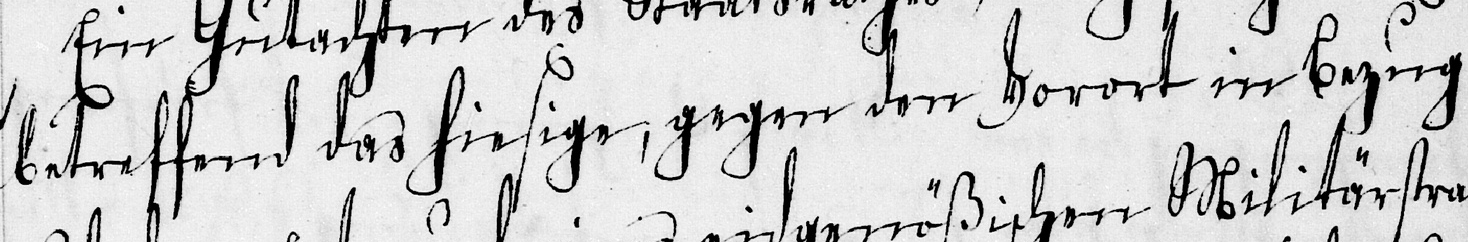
betreffend das hiesige, gegen den Vorort in Bezug
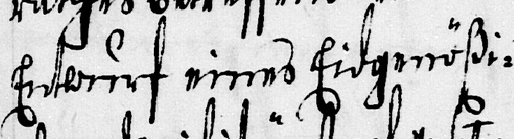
Entwurf eines eidgenößi¬
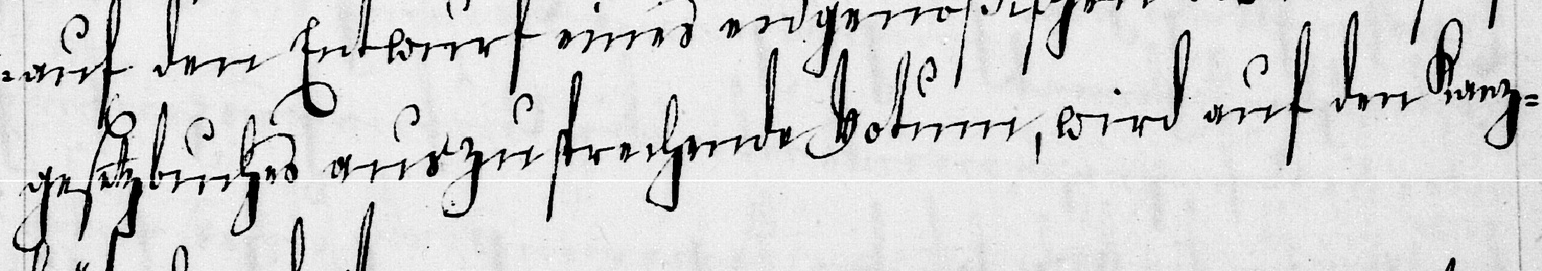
gesetzbuches auszusprechende Votum, wird auf den Kanz¬
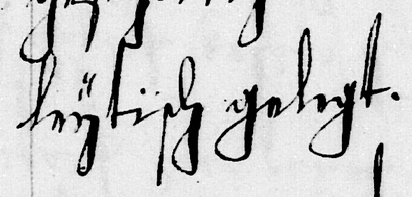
leytisch gelegt.
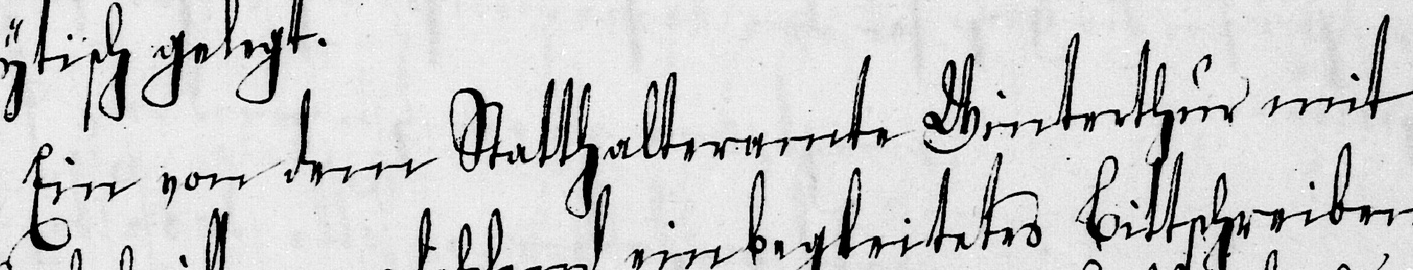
Ein von dem Statthalteramte Winterthur mit
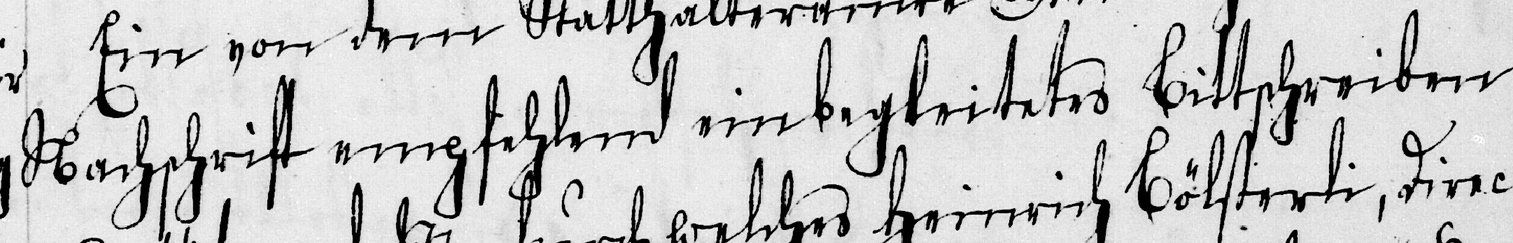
Nachschrift empfehlend einbegleitetes Bittschreiben
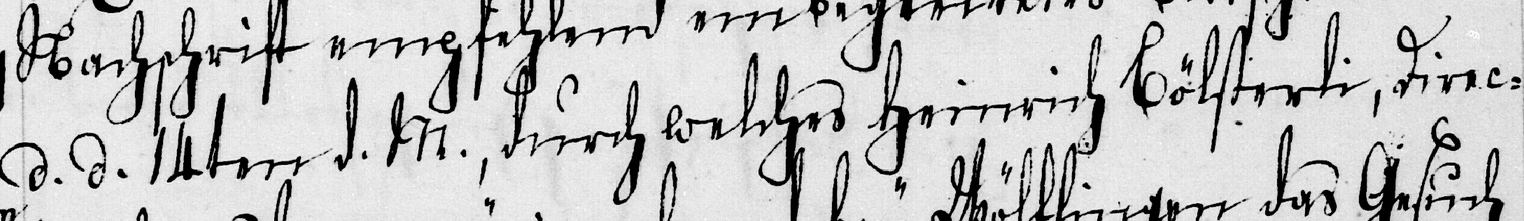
d. d. 14ten d. M., durch welches Heinrich Bölsterli, Direc¬
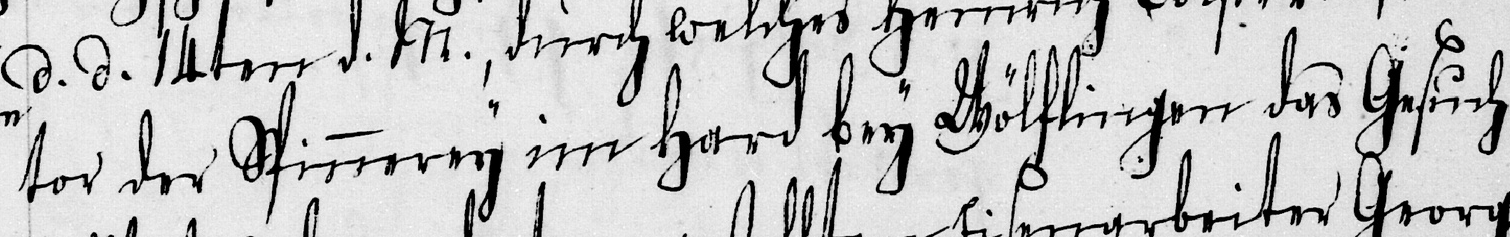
tor der Spinnerey im Hard bey Wölflingen das Gesuch
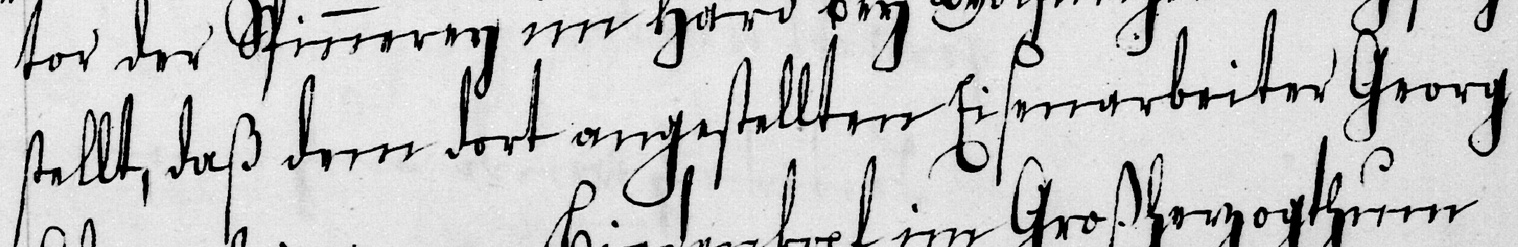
tellt, daß dem dort angestellten Eisenarbeiter Georg
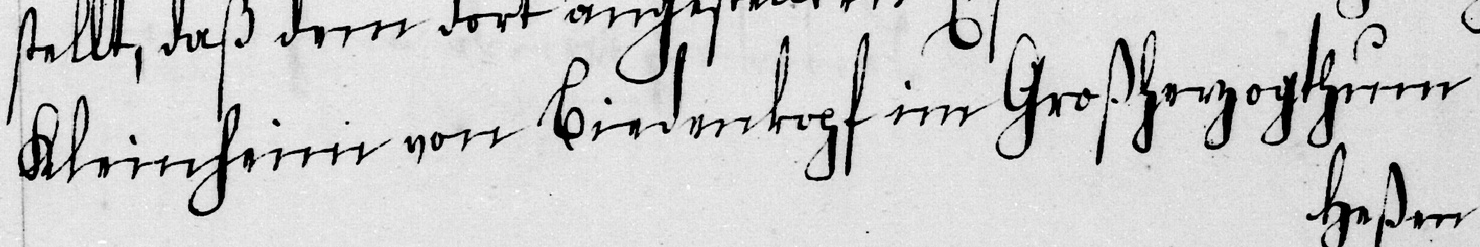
Kleinheim von Biedenkopf im Großherzogthum
